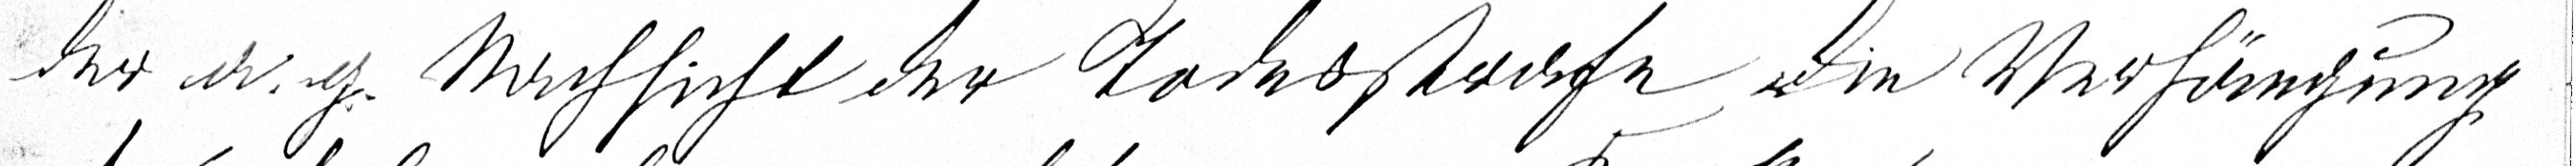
der a. g. Nachsicht der Todesstrafe die Verhängung
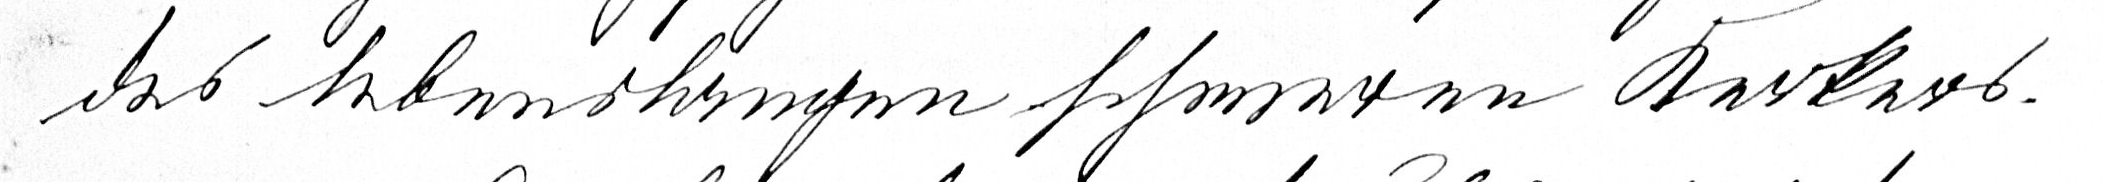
des lebenslangen schweren Kerkers.
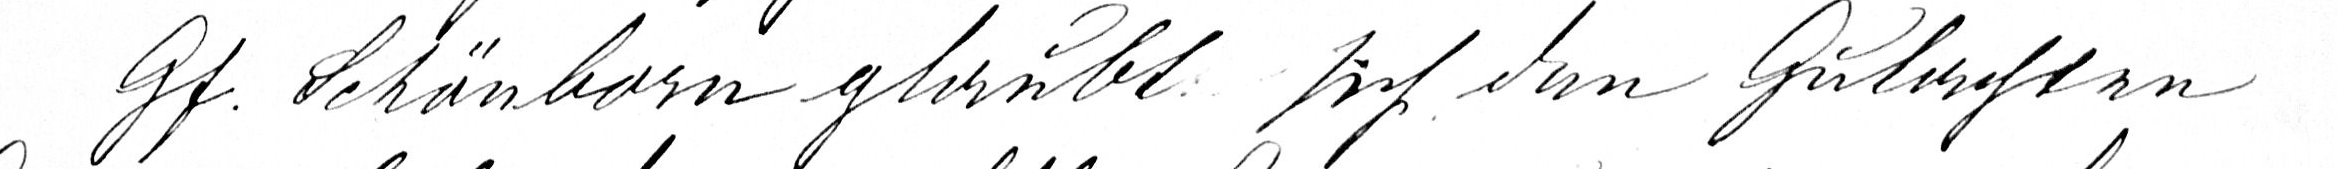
Gf. Schönborn glaubt sich den Gudachten
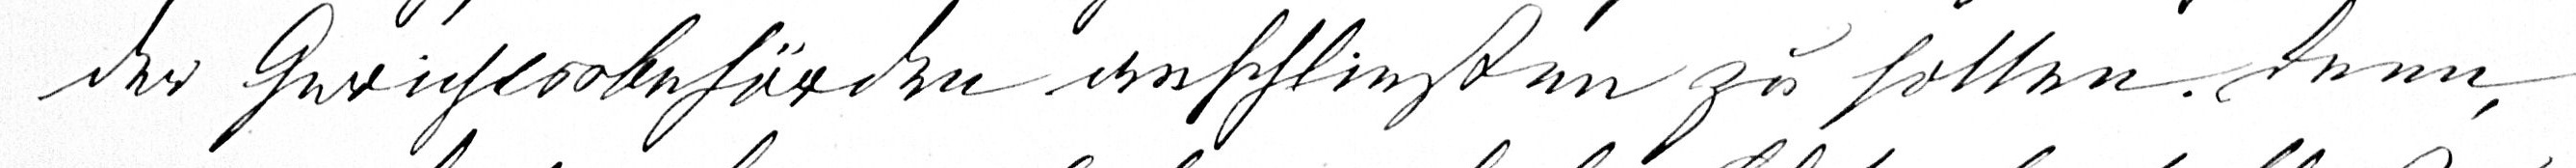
der Gerichtsobehörden anschließen zu sollen. Denn,
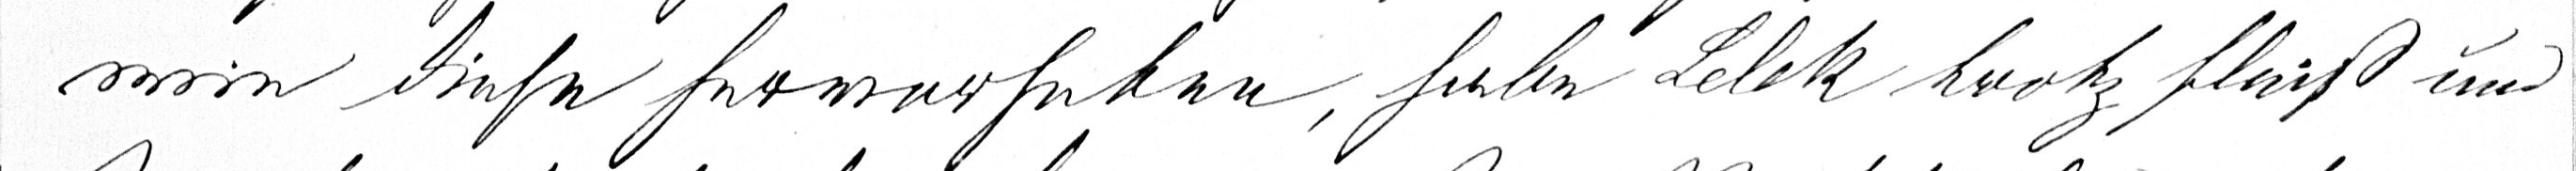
wie diese herverheben, habe Lelek trotz fleiß und
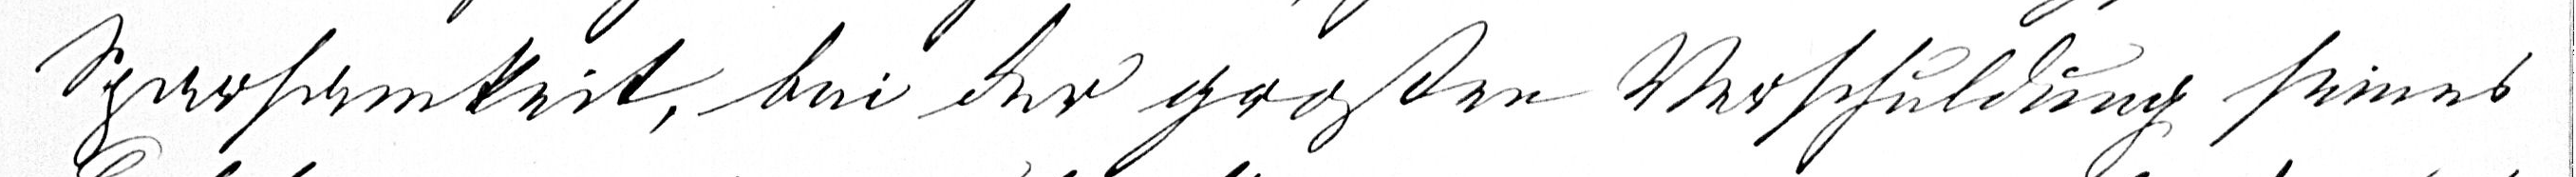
Sparsamkeit, bei der großen Verschuldung, seines
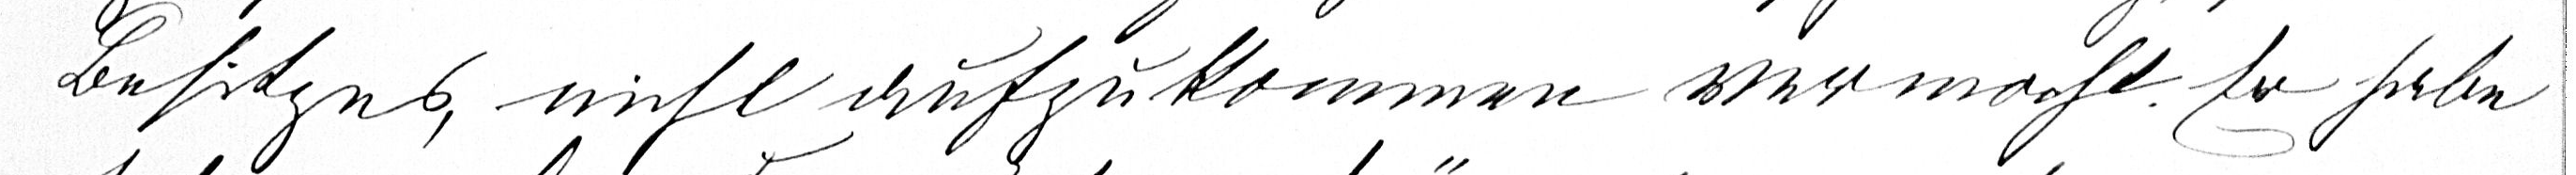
Besitzes, nicht aufzukommen vermocht. Er habe
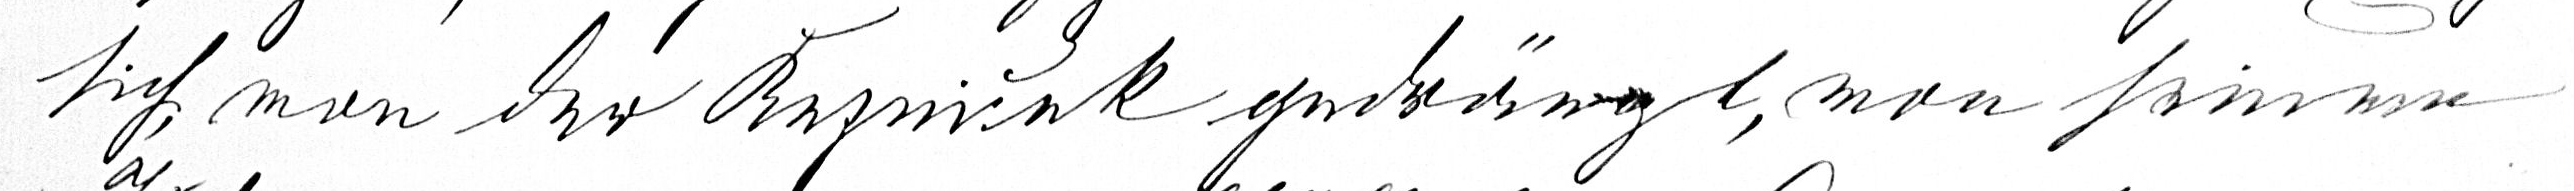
sich, mon der Rezniček gedrängt, mon seinem
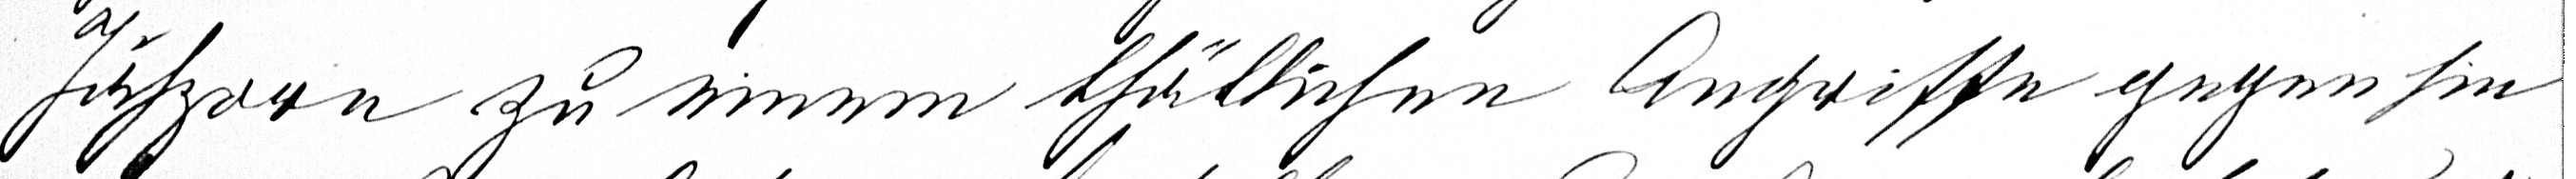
Jähzorn zu einem thätlichen Angriffe gegen sie
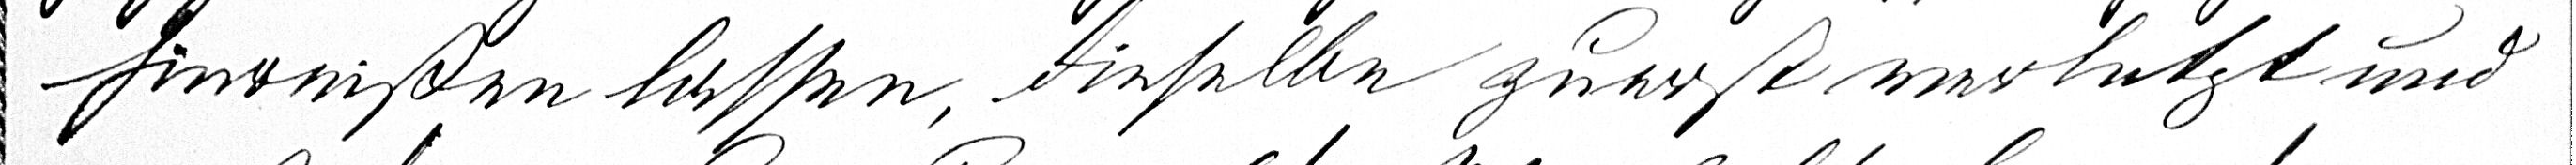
hinreißen lassen, dieselbe zuerst verletzt und
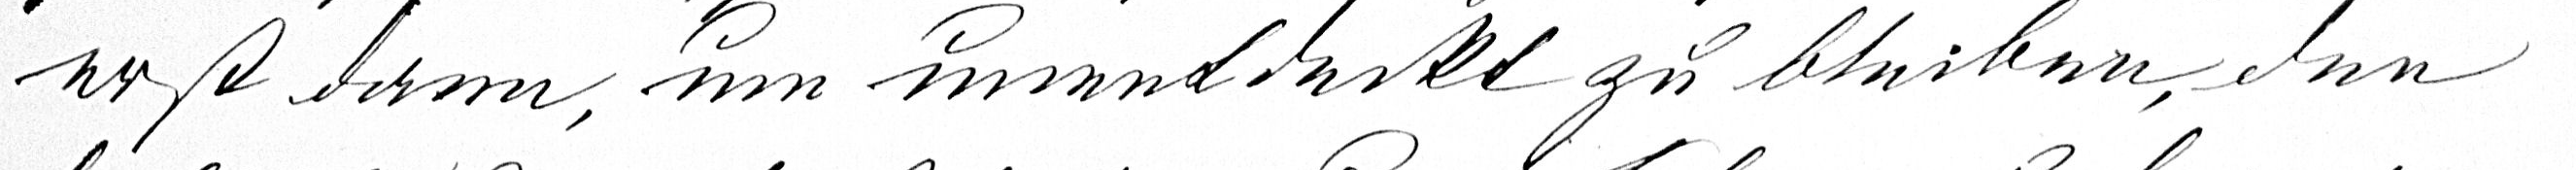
erst dann, um unentdeckt zu bleiben, den
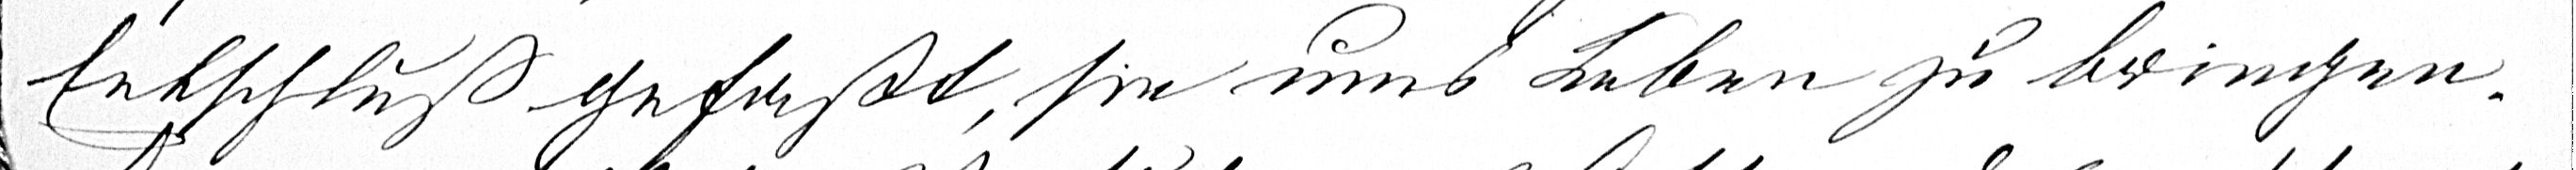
Entschluß gefaßt, sie uns Leben zu bringen.
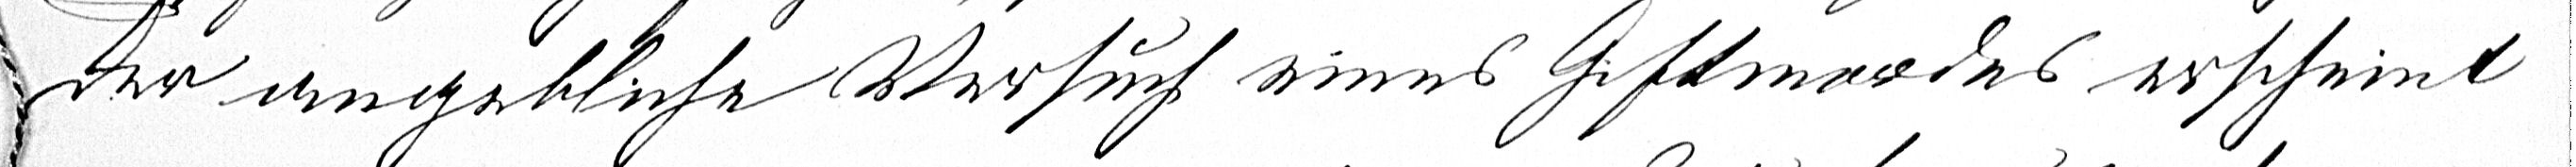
Der angebliche Versuch eines Giftmordes erscheint
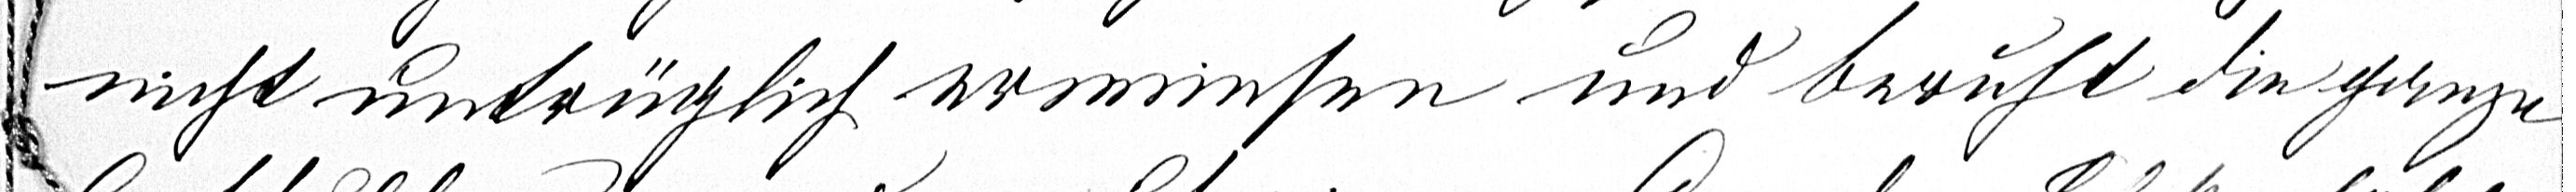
nicht untrüglich erwiesen und beruht die ganze
